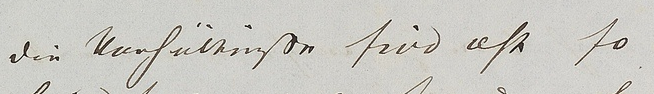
die Verhältnisse sind oft so
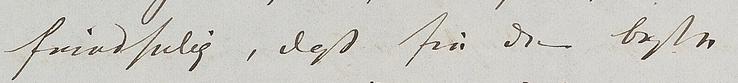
feindselig, dass sie der beste
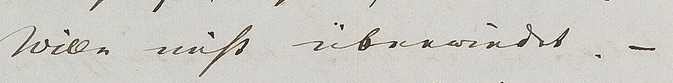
Wille nicht überwindet. –
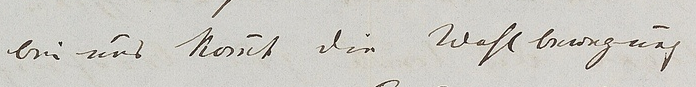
Bei uns kommt die Wahlbewegung
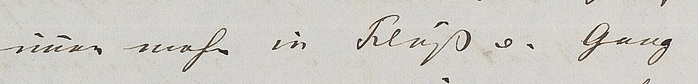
immer mehr in Fluss &. Gang,
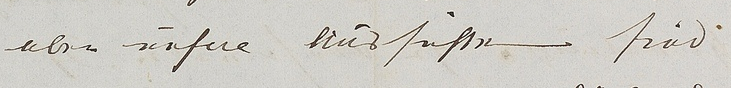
aber unsere Aussichten sind
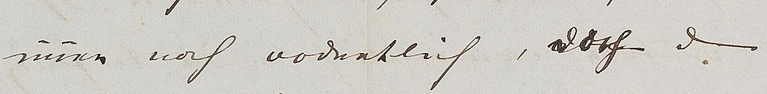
immer noch ordentlich, doch der
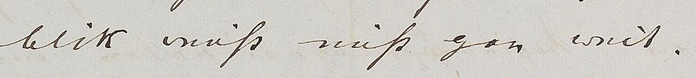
Blik reicht nicht gar weit.
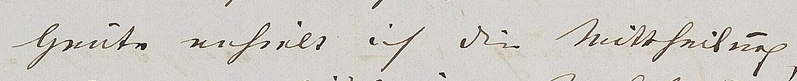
Heute erhielt ich die Mittheilung,
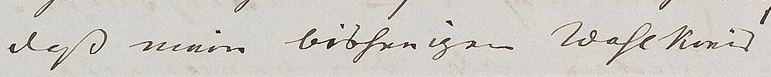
dass mein bisheriger Wahlkreis
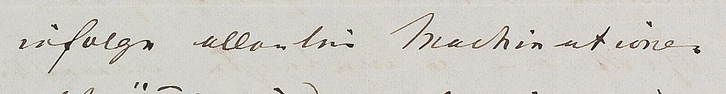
infolge allerlei Machinationen
